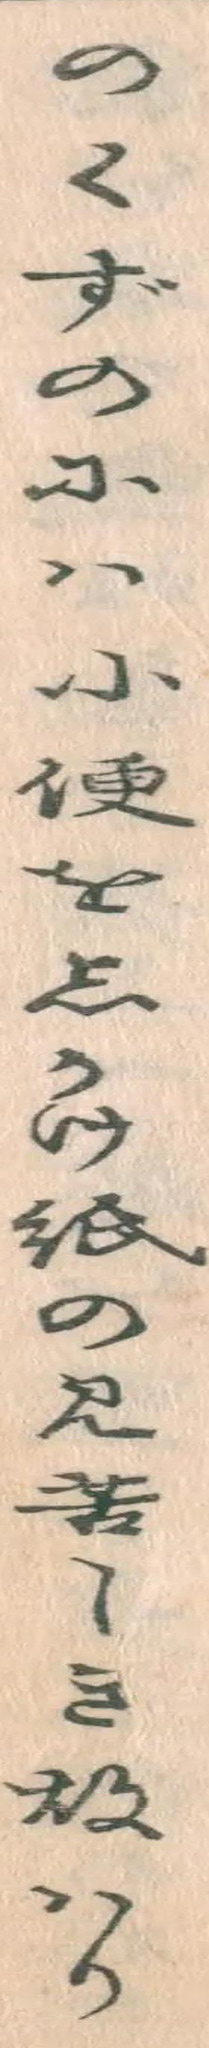のくずのには小便をしかけ紙の見苦しき故はり
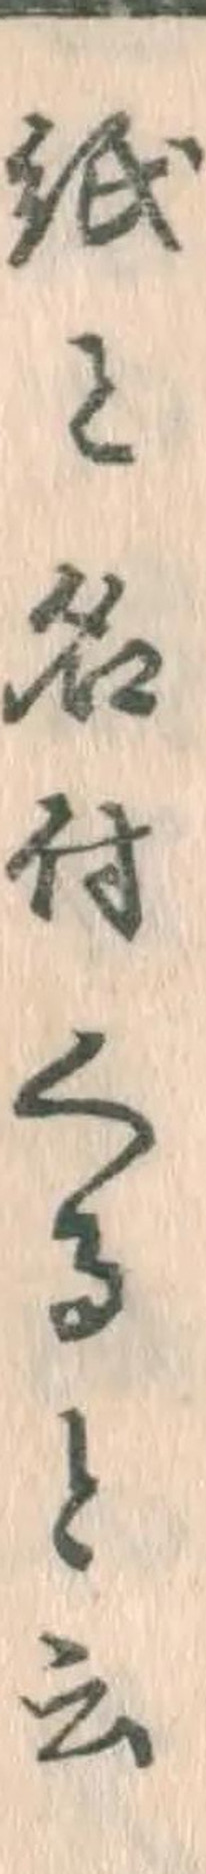紙と名付くると云
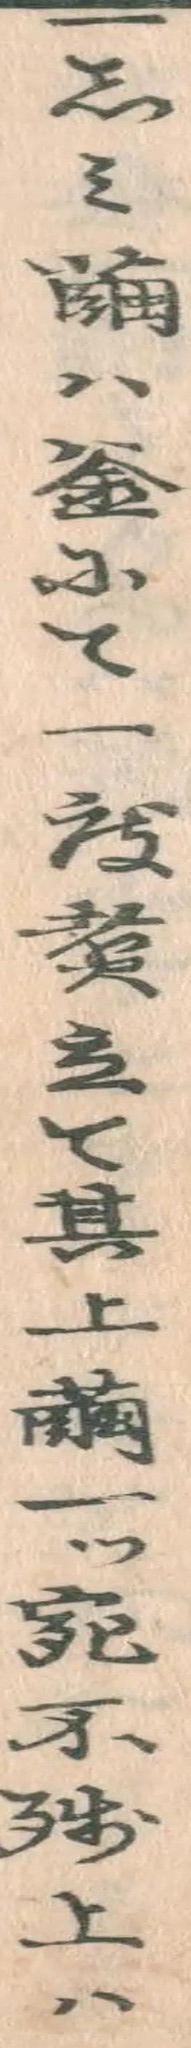一しみ繭は釜にて一度煮立て其上繭一ッ宛不残上は
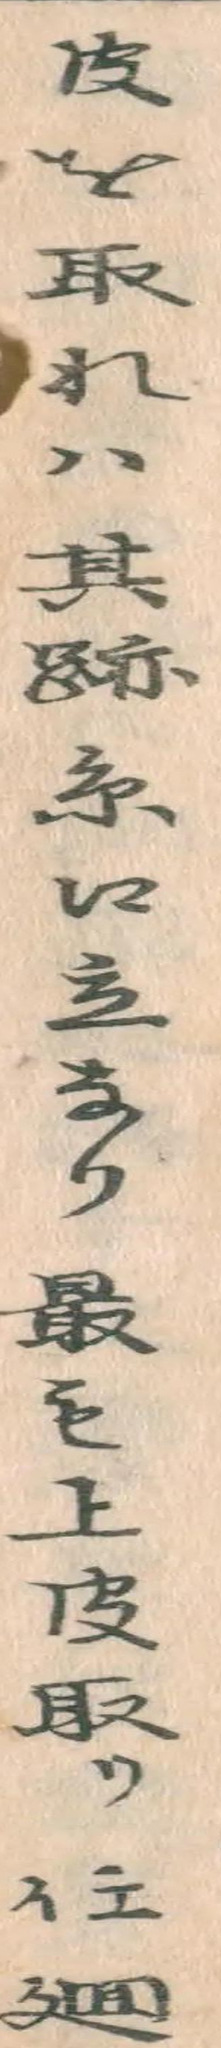皮を取れは其跡糸口立なり最も上皮取り仕廻
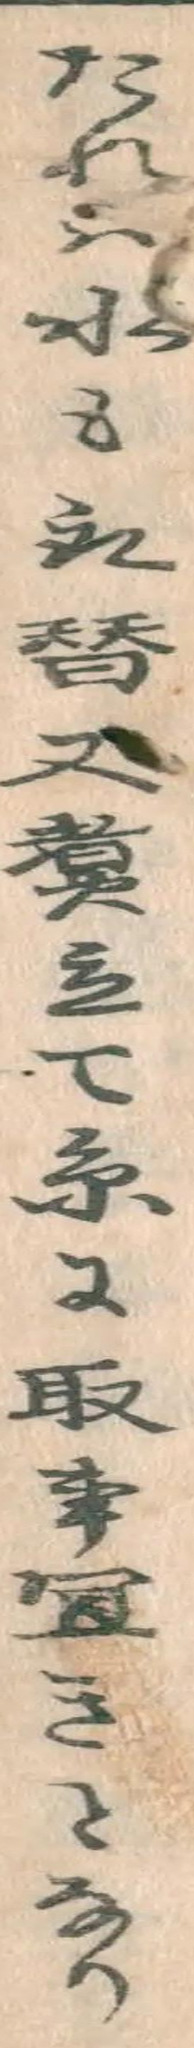たれは水も取替又煮立て糸に取事宜きとなり

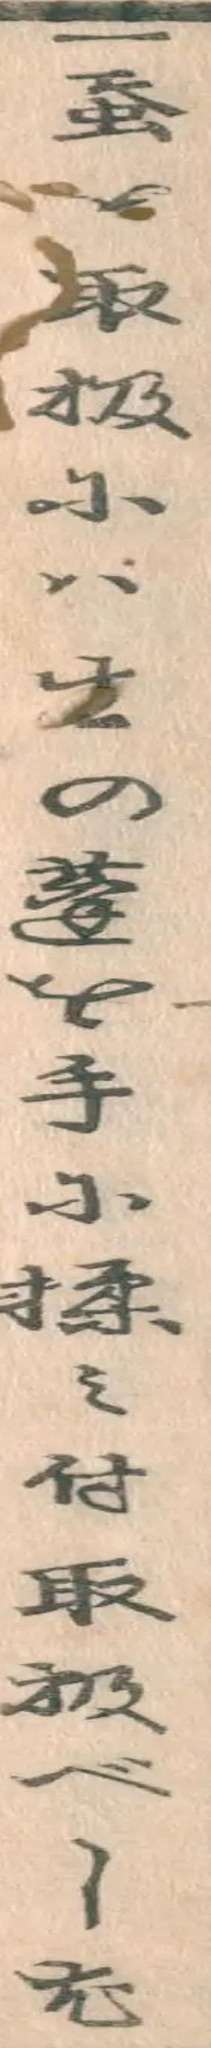一蚕を取扱には生の蓬を手に揉み付取扱べし尤
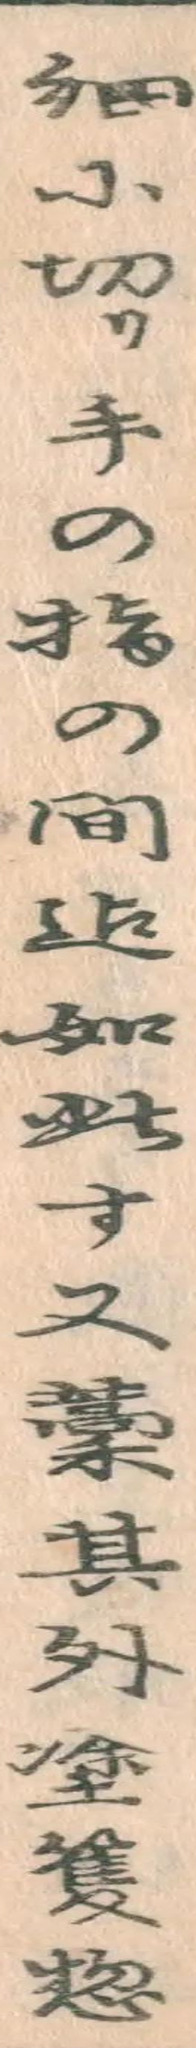細に切り手の指の間迄如此す又藁其外塗篗惣
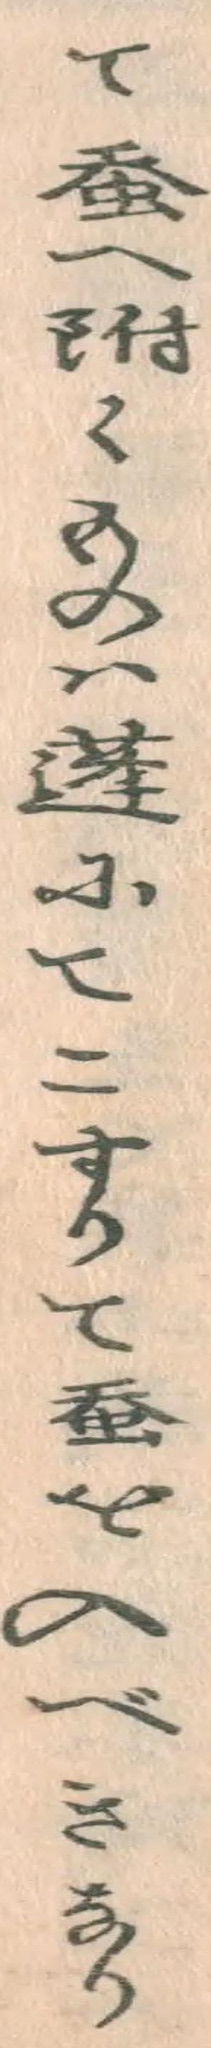て蚕へ附くものは蓬にてこすりて蚕を入べきなり
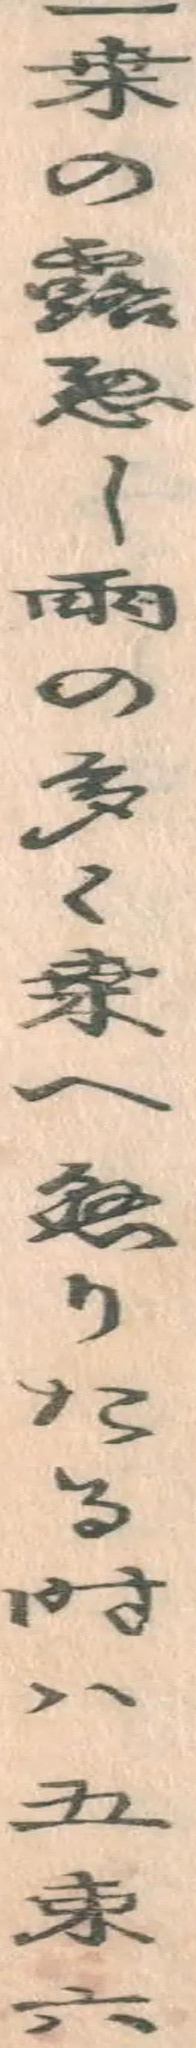一桑の露悪し雨の多く桑へ懸りたる時は五束六
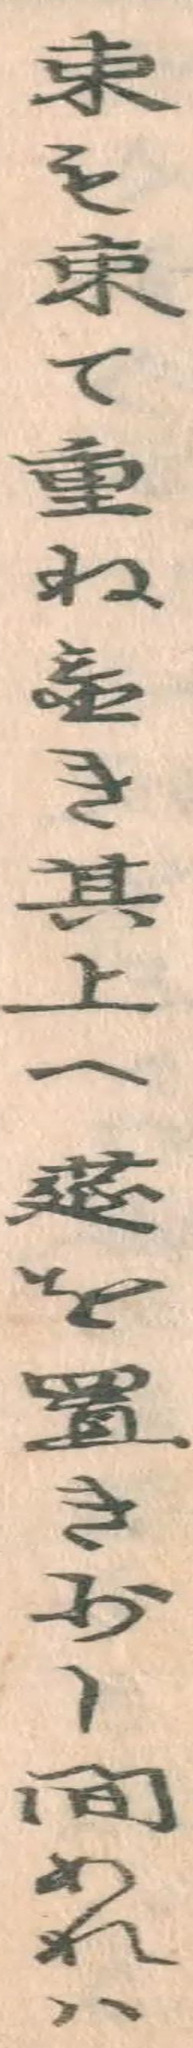束を束て重ね置き其上へ莚を置き少し間あれは
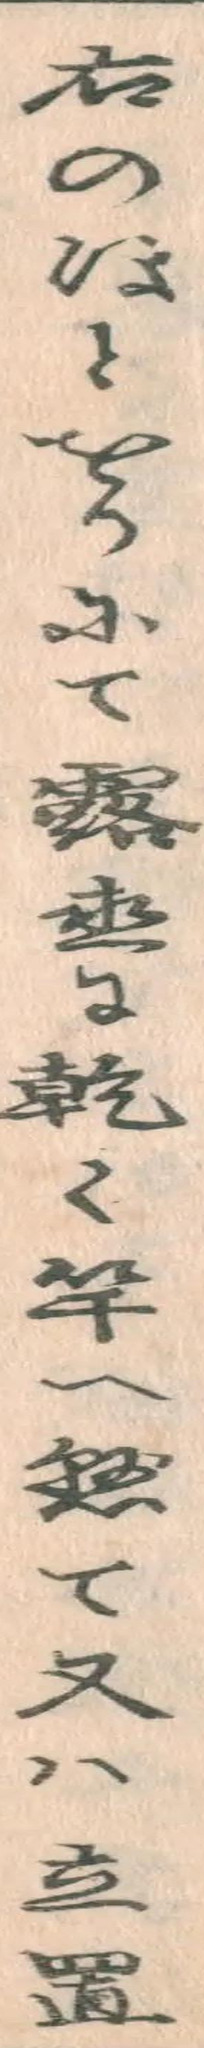右のほとをりにて露直に乾く竿へ懸て又は立置
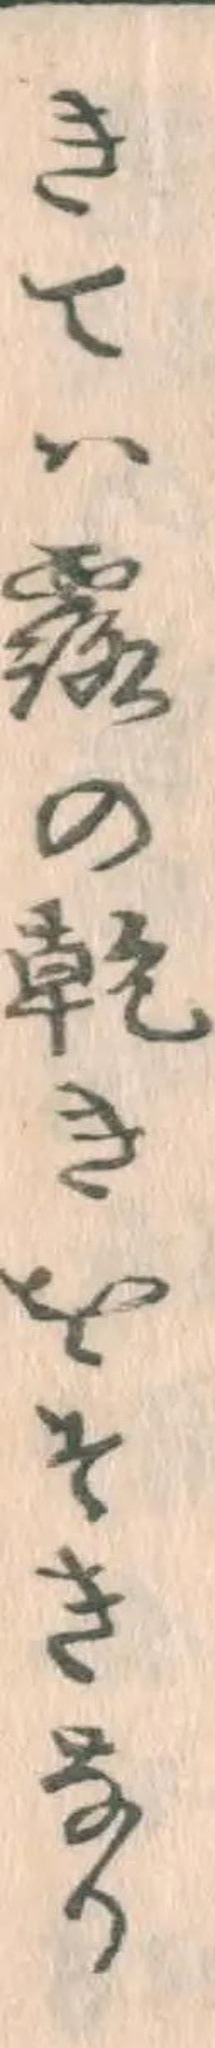きては露の乾きをそきなり
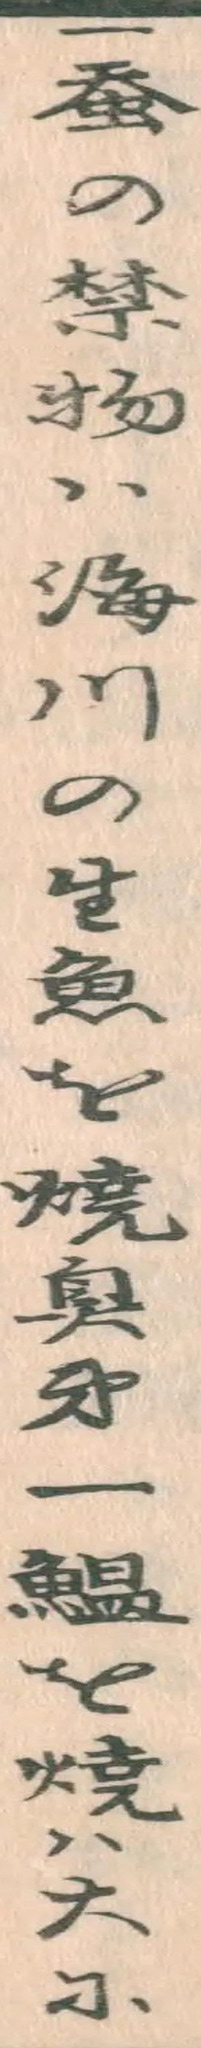一蚕の禁物は海川の生魚を焼臭第一鰛を焼は大に
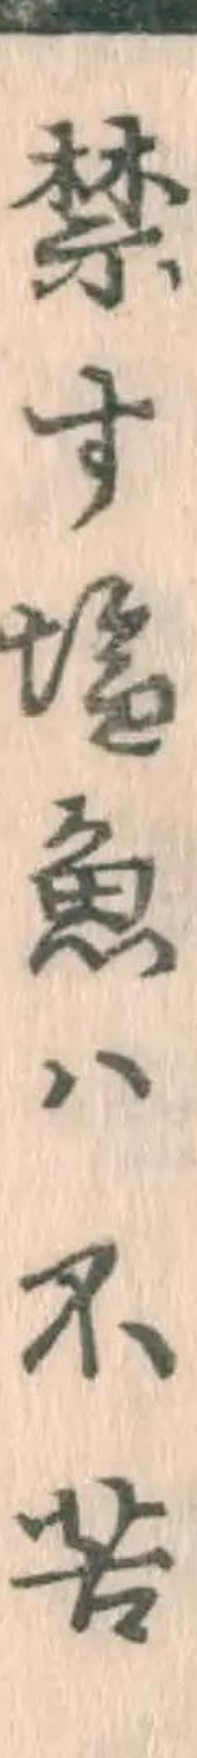禁す塩魚は不苦
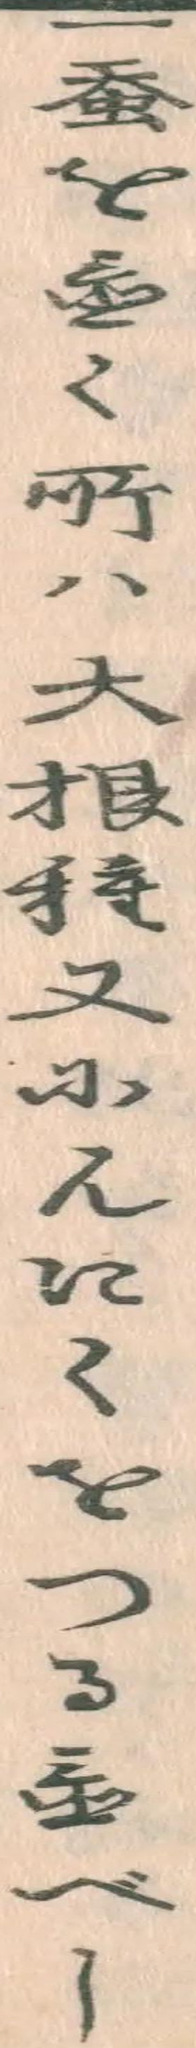一蚕を置く所は大根種又にんにくをつる置べし
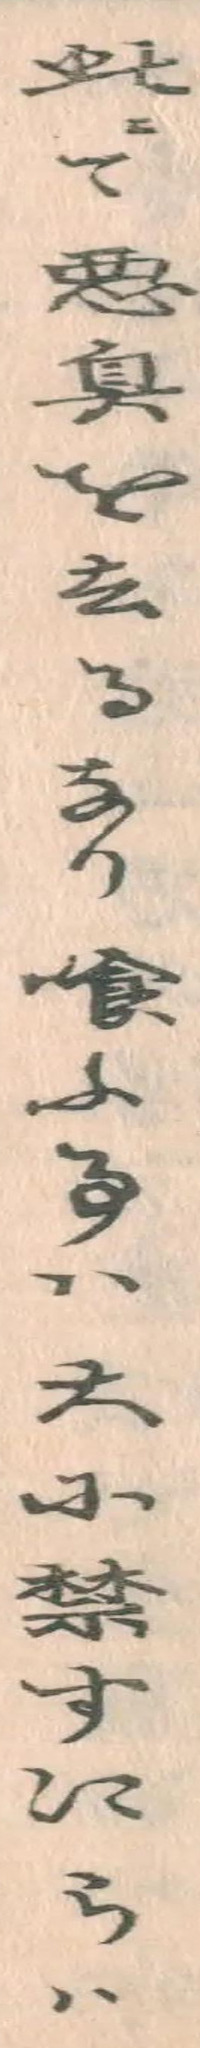此にて悪臭を去るなり喰ふ事は大に禁すにらは
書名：機織彙編 5巻. [1]
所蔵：国立国会図書館 National Diet Library, JAPAN
